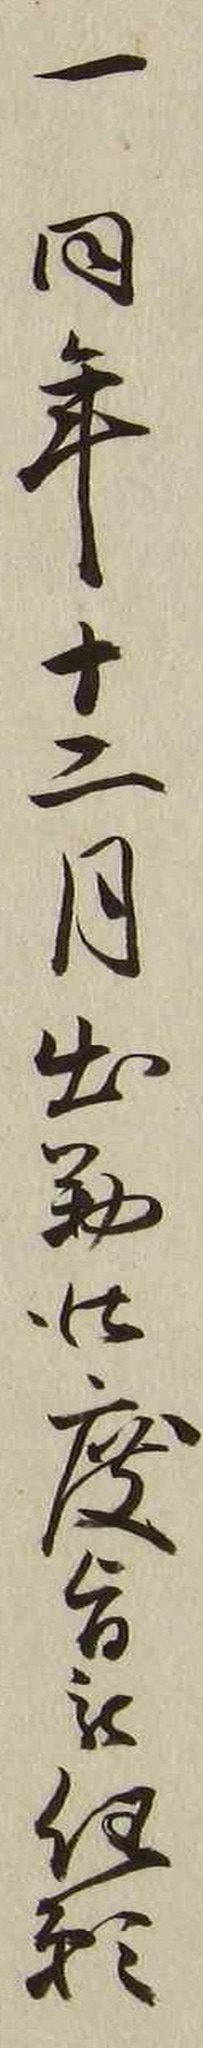一同年十二月出勤仕度旨被任願
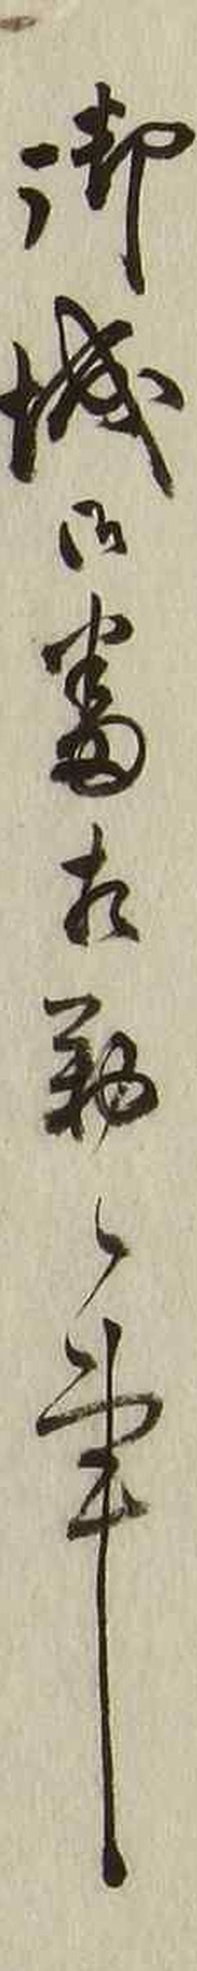御城御番相勤候事
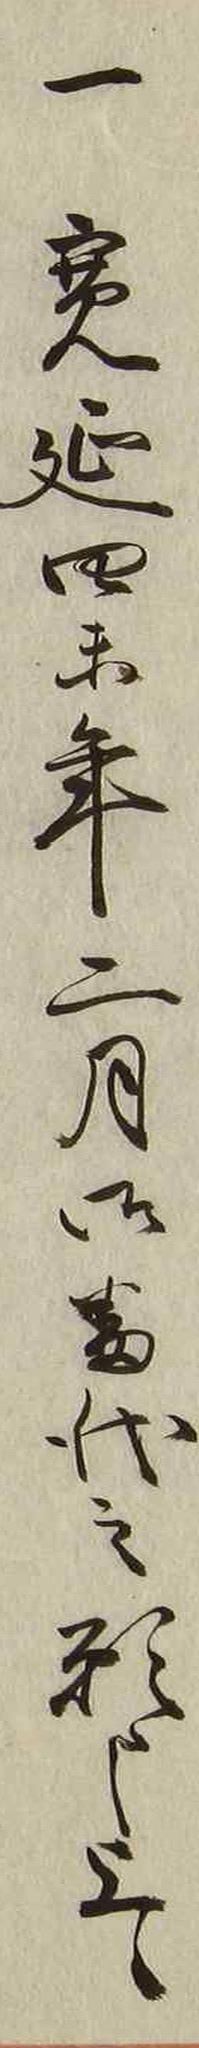一寛延四未年二月御番代之願申上候
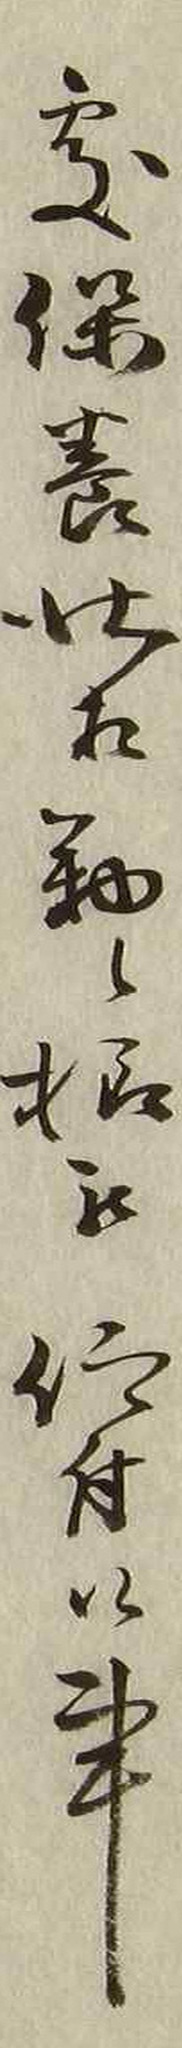処保養仕相勤候様被仰付候事
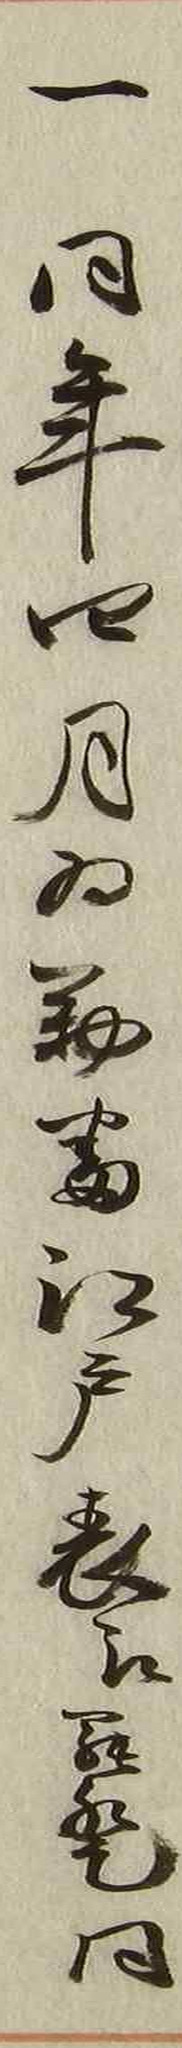一同年四月為勤番江戸表江罷登同
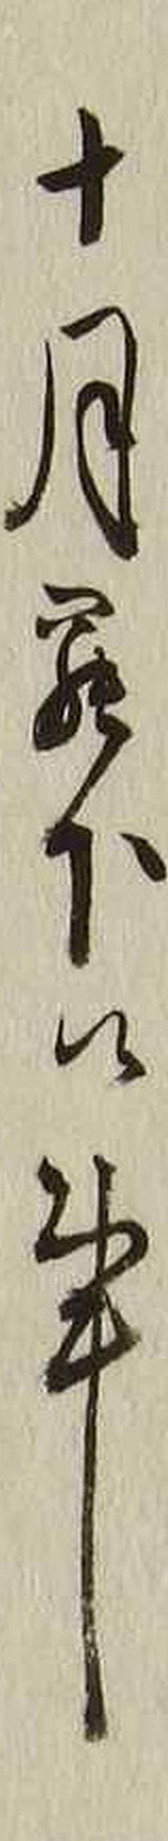十月罷下候事
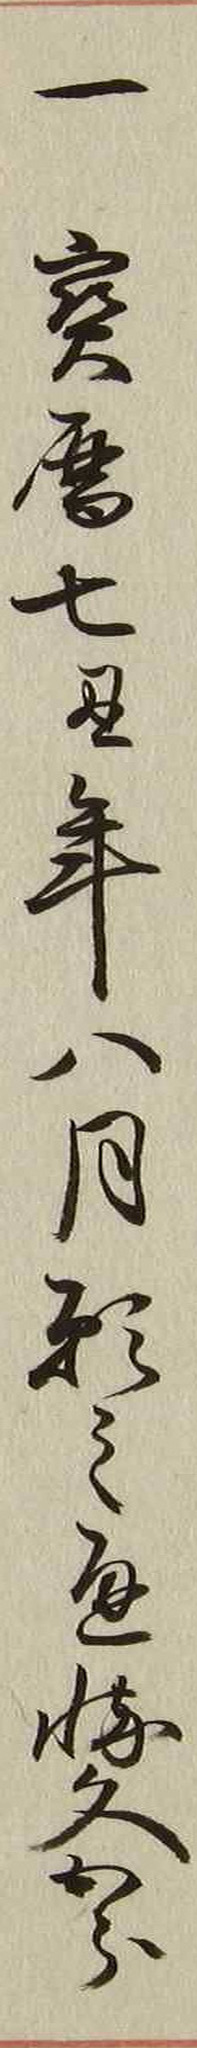一宝暦七丑年八月願之通忰久五郎
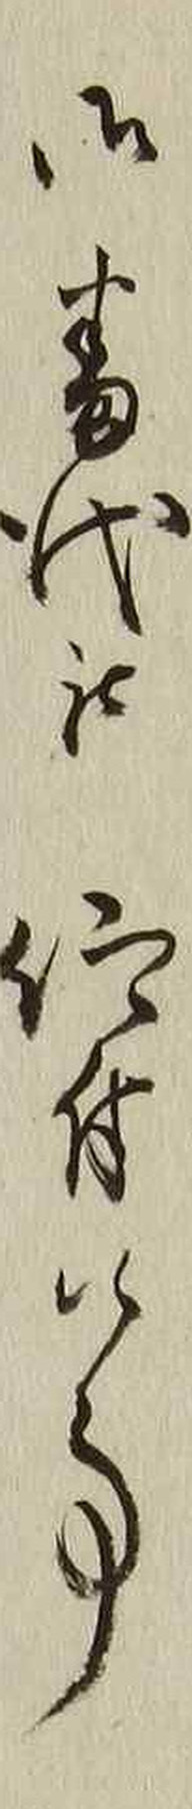御番代被仰付候事
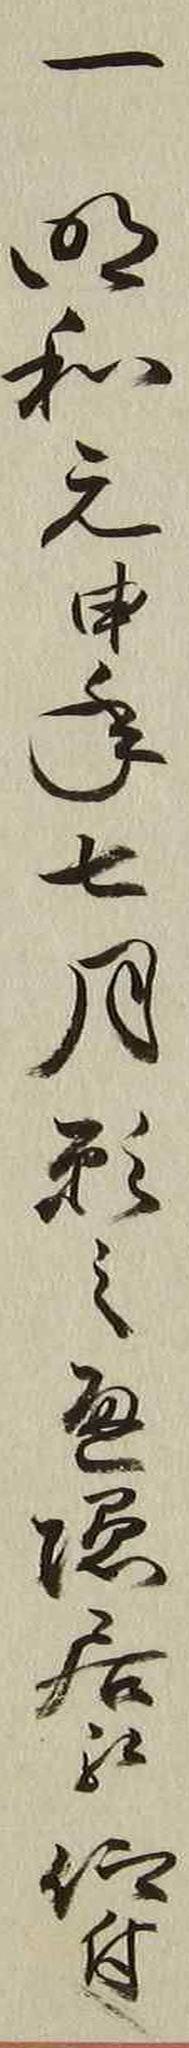一明和元申年七月願之通隠居被仰付
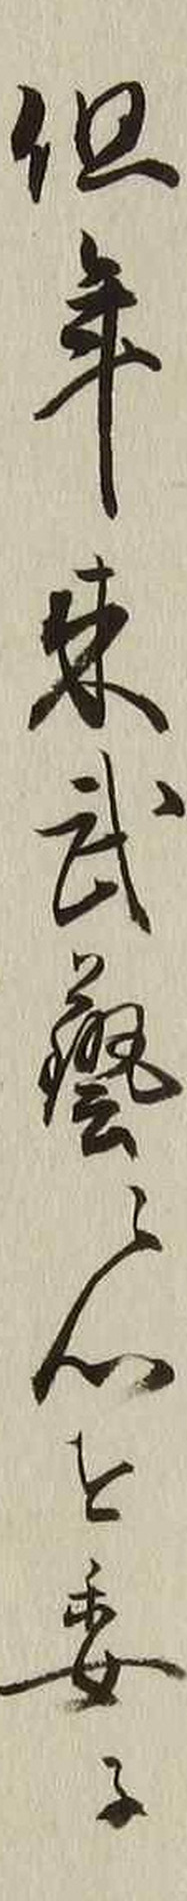但年来武芸ニ心を委ね
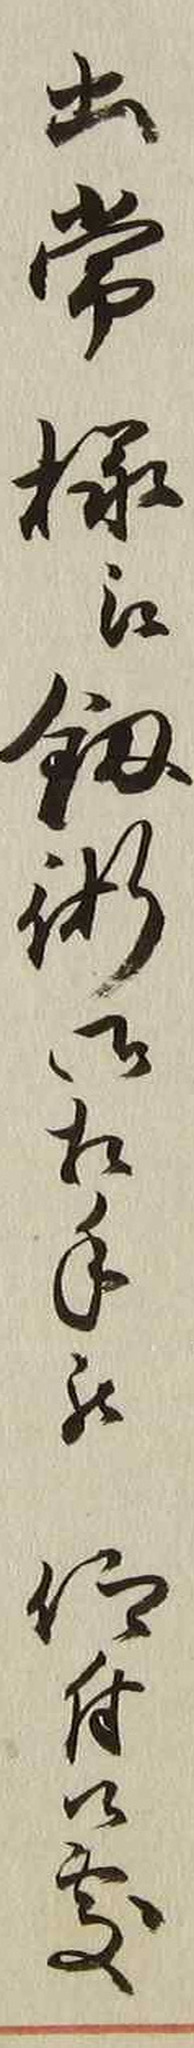土常様江剣術御相手被仰付候処
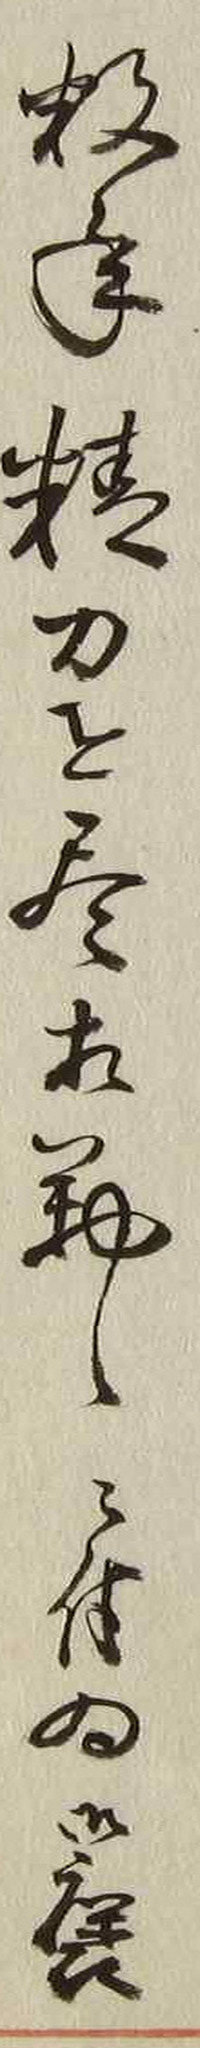数年精力を尽相勤候ニ付為御褒
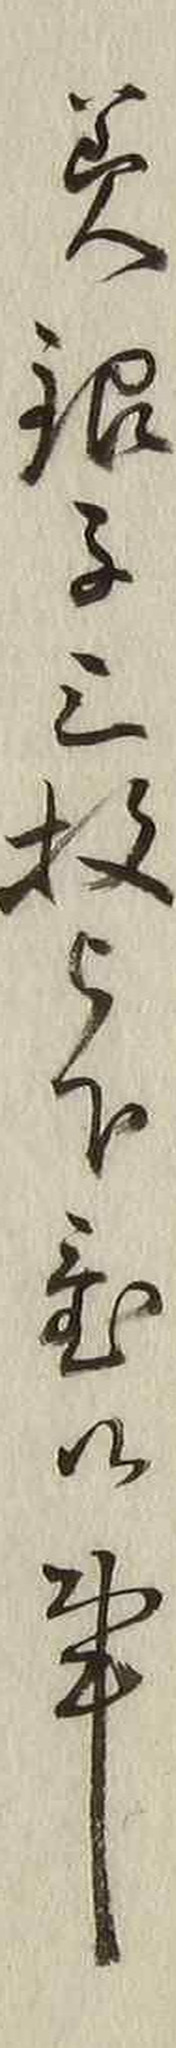美銀子三枚被下置候事
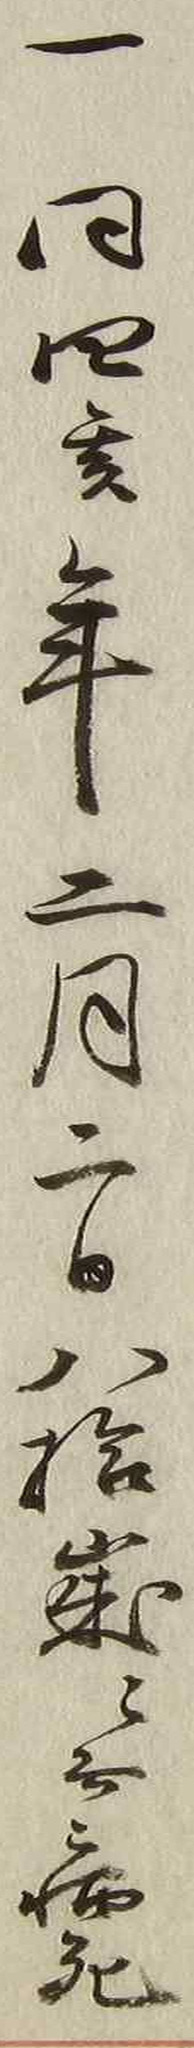一同四亥年二月二日八拾歳ニ而病死
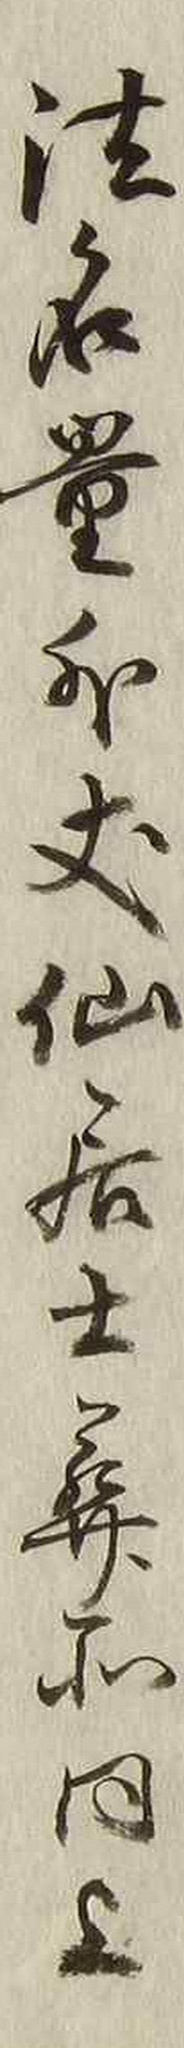法名量外丈仙居士葬所同上
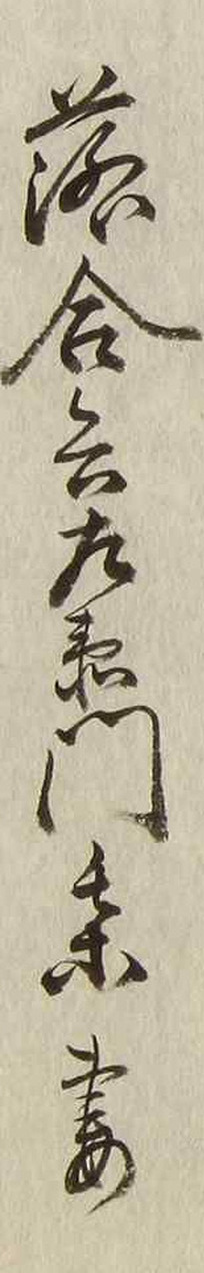女落合兵左衛門某妻
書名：諸士系譜　巻之15　い之部15
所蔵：会津若松市立会津図書館
